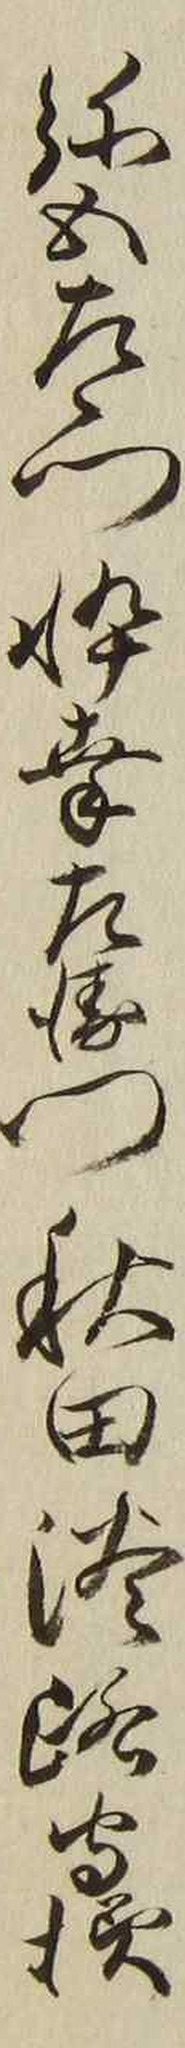弥五左衛門忰幸左衛門秋田淡路守様
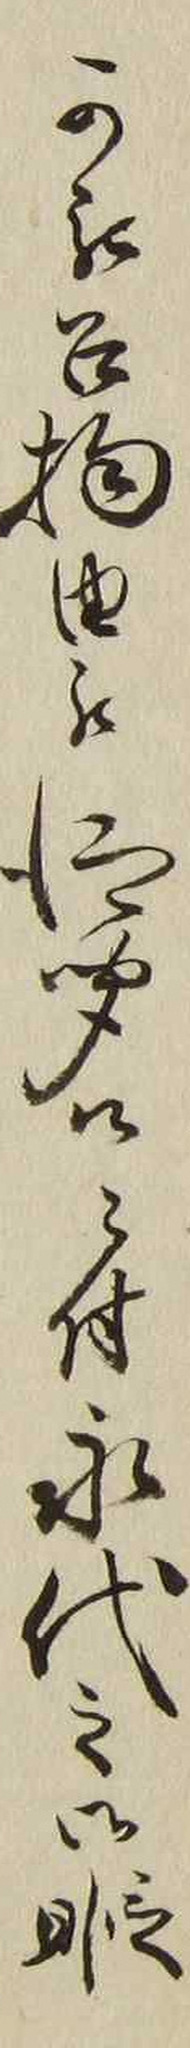可被召抱由被仰聞候ニ付永代之御暇
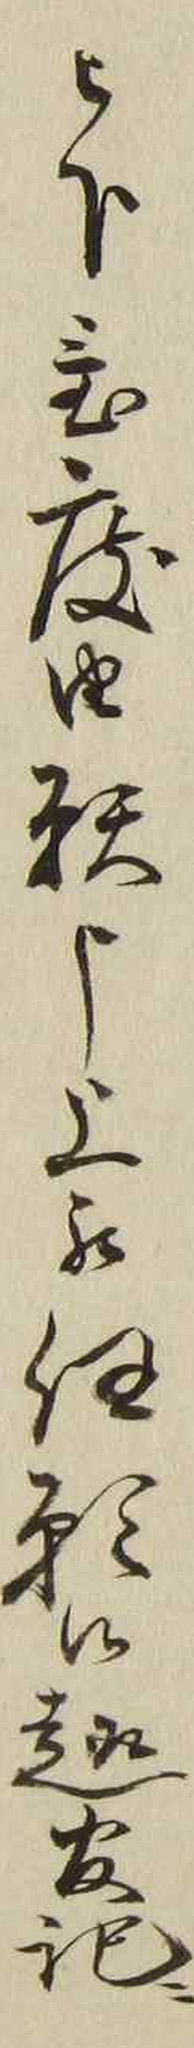被下置度由願申上被任願候趣官記ニ

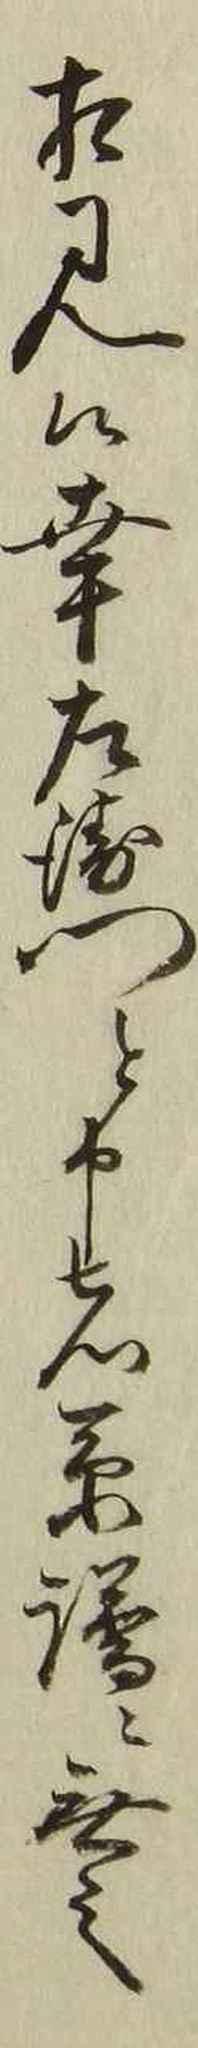相見候幸左衛門と申者系譜ニ無之
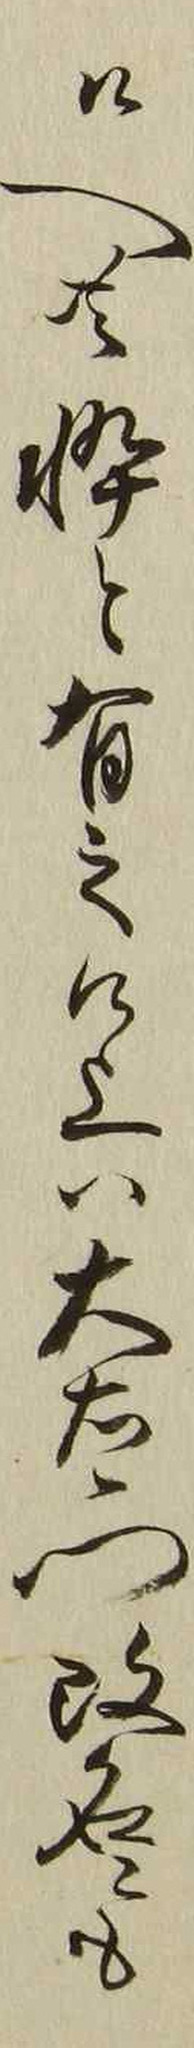候へ共忰と有之候上ハ大右衛門改名ニも
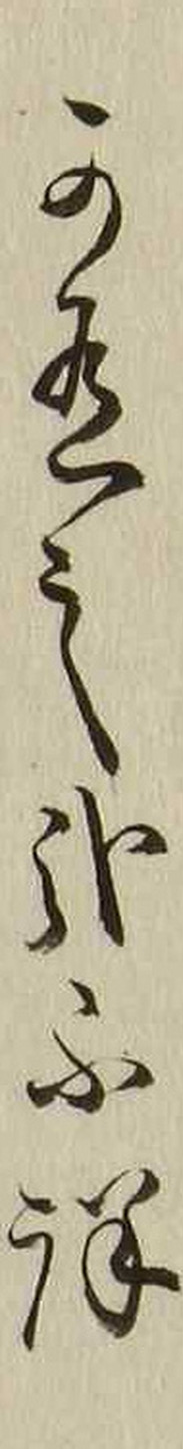可有之哉不詳
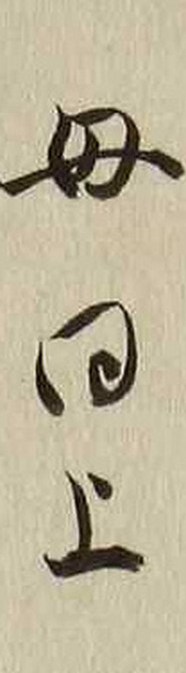母同上
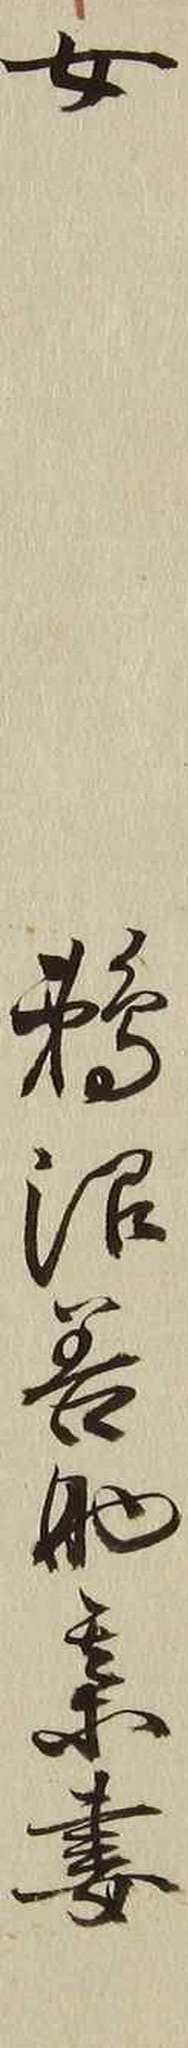女鵜沼善助某妻
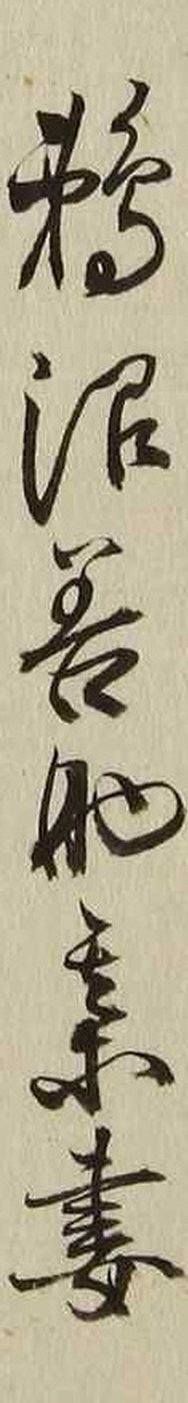女鵜沼善助某妻
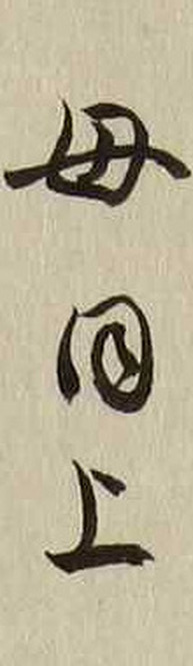母同上
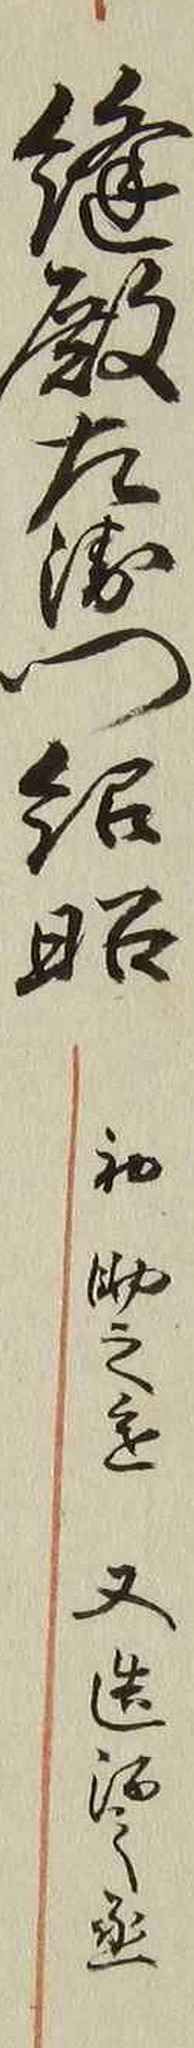縫殿左衛門紹昭初助之進又造酒之丞
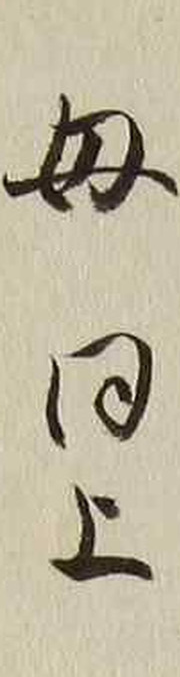母同上
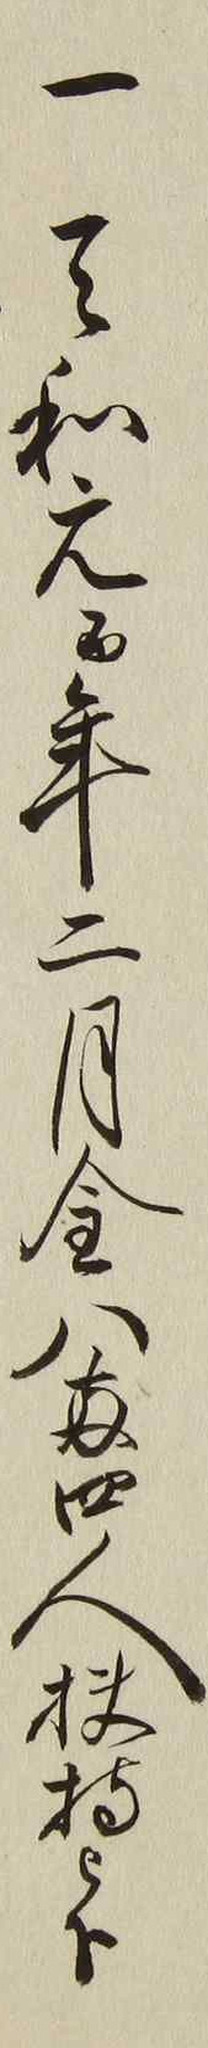一天和元酉年二月金八両四人扶持被下
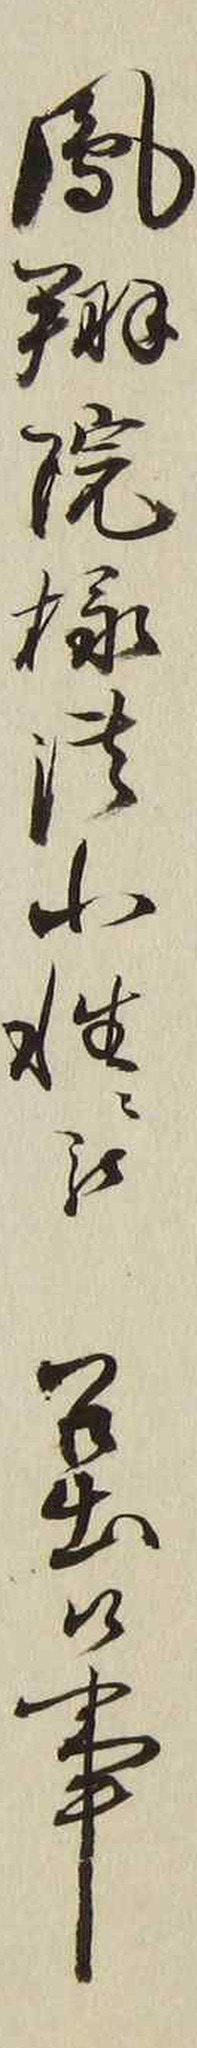鳳翔院様御小姓ニ被召出候事
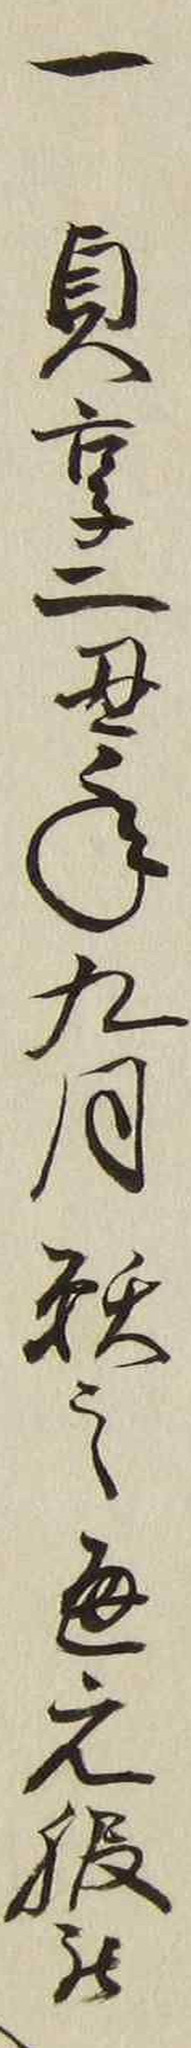一貞享二丑年九月願之通元服被
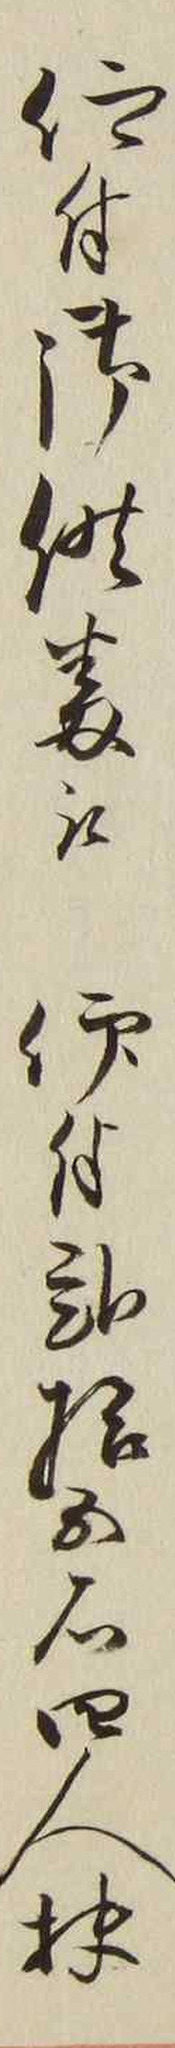仰付御供番被仰付弐拾五石四人扶
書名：諸士系譜　巻之60　と之部3
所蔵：会津若松市立会津図書館
